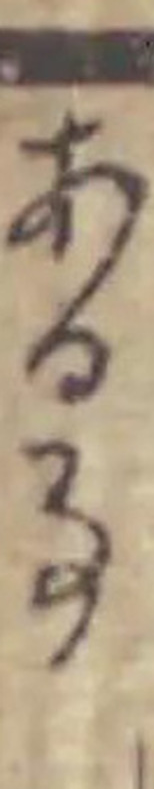ある事
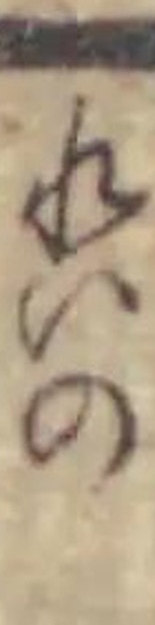れいの
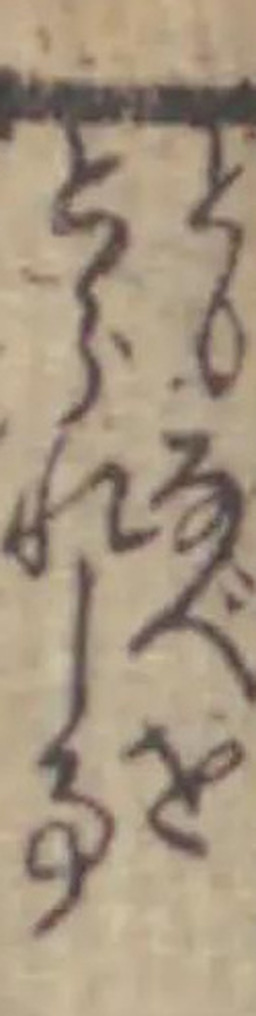とられし事
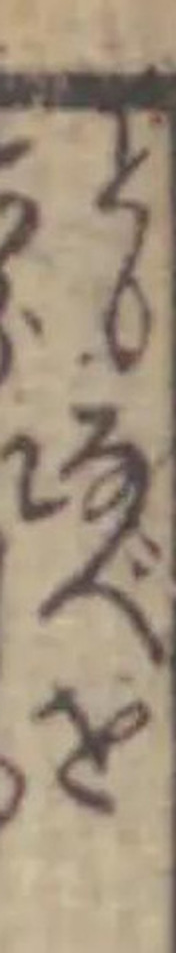ともなべを
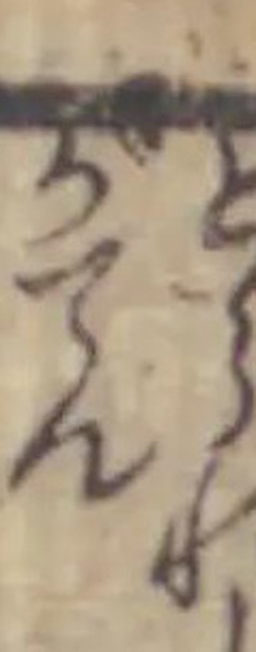がてん
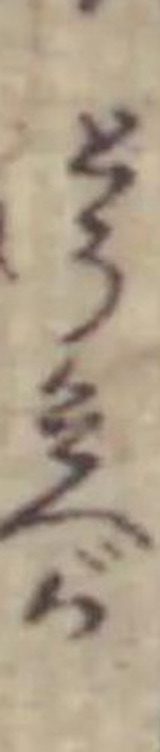とう兵へが
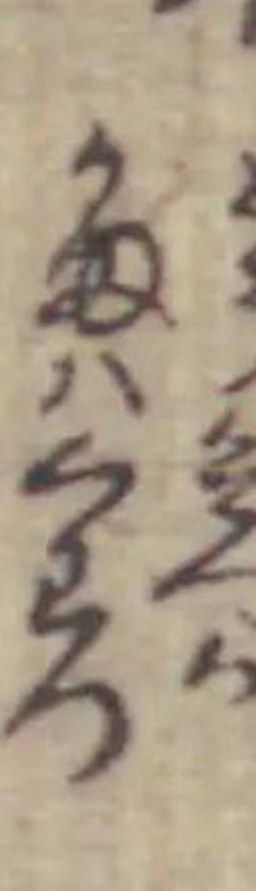かまはくわつ
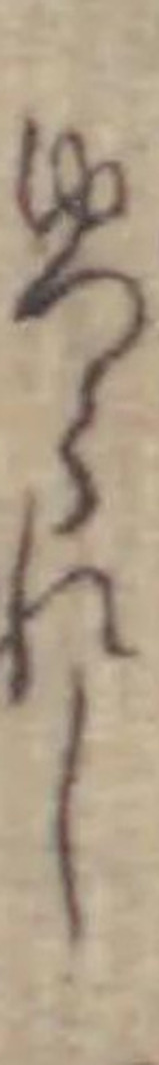ゆつられし
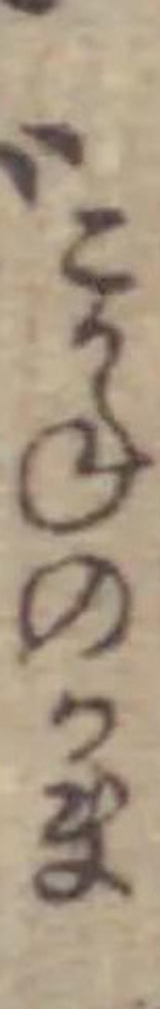こかねのかま
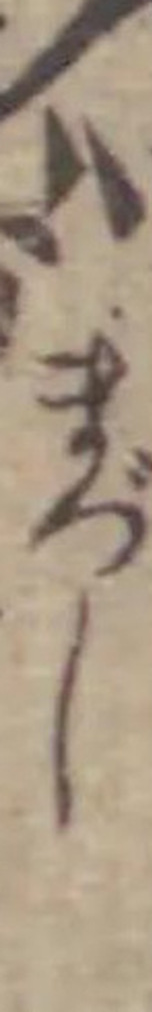まづし
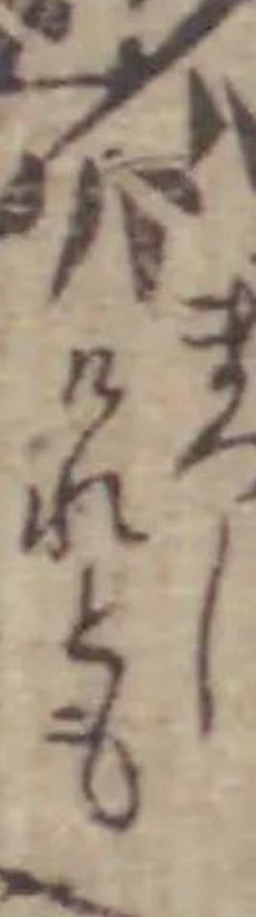けれとも
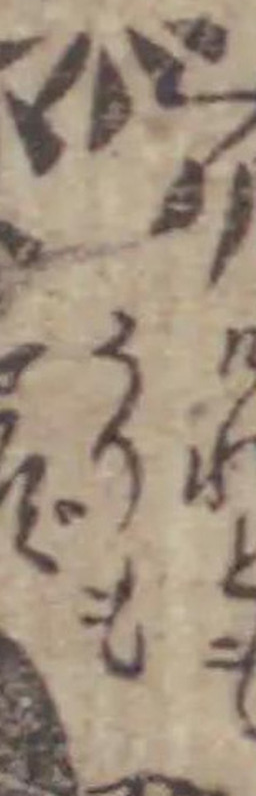うりも
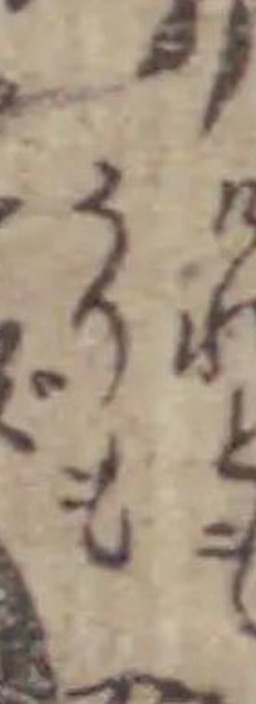うりも
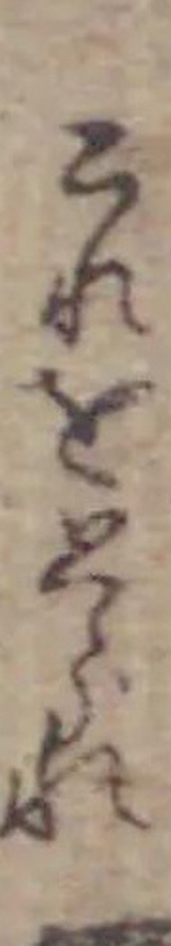これをとられ
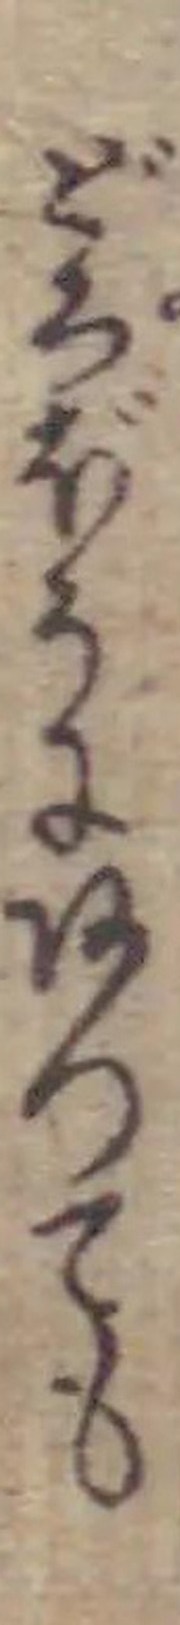どろぼうにあつても
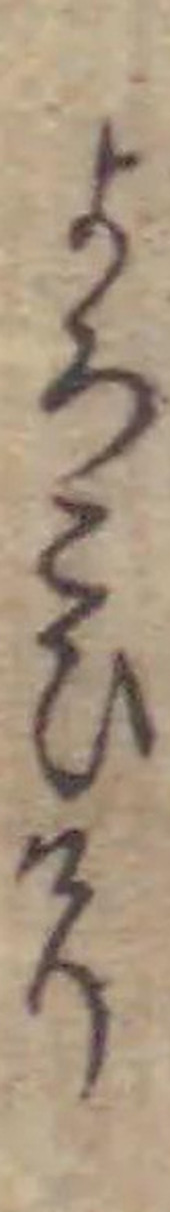よろこひけり
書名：間違月夜鍋 2巻
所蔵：国立国会図書館 National Diet Library, JAPAN
